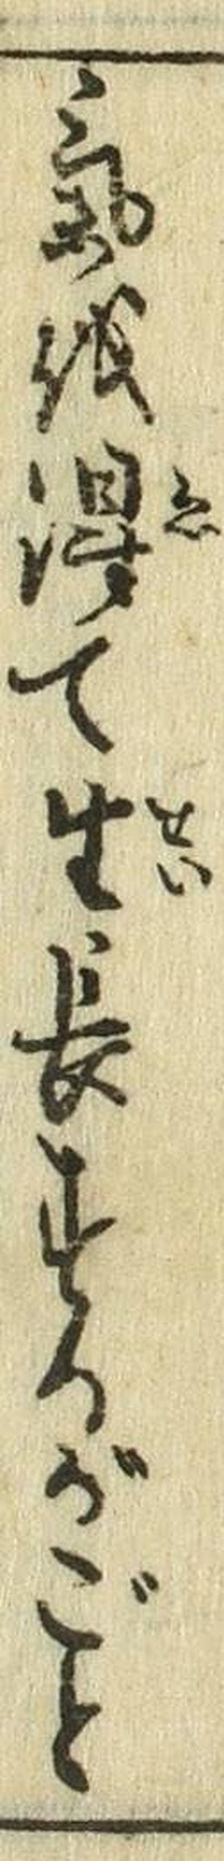気を得て生長するがごと
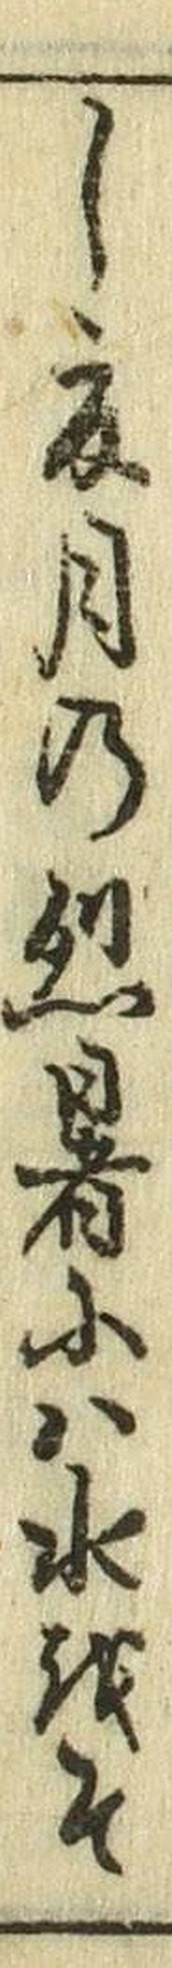し夏月の烈暑には水をそ
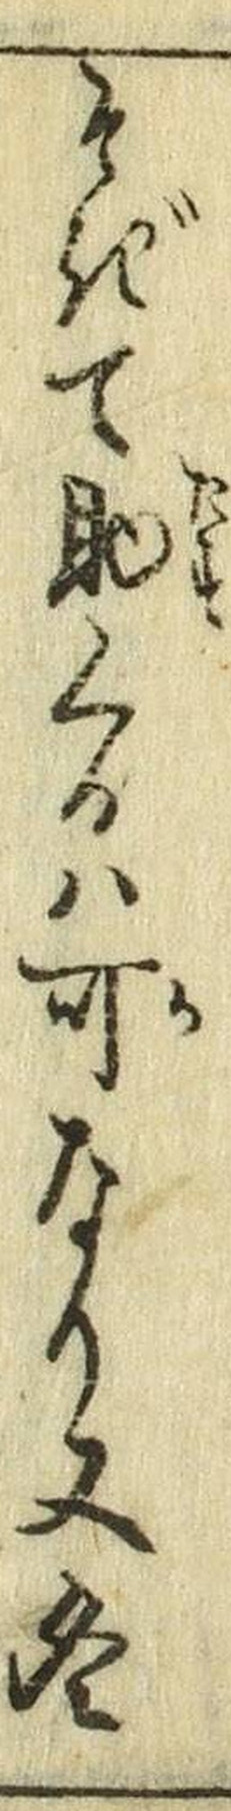そぎて助くるは可なり又冬
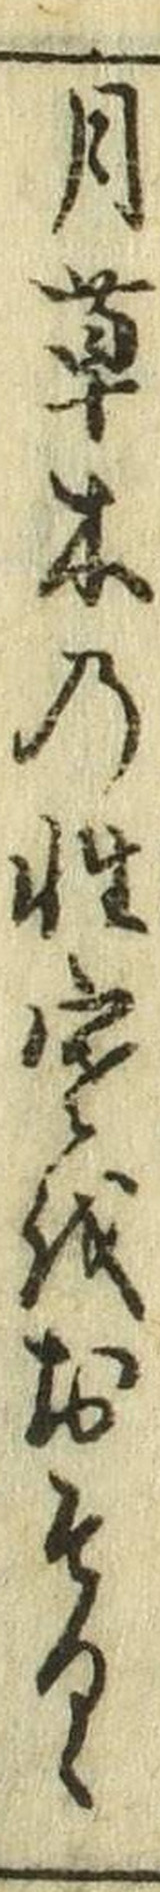月草木の性寒をおそるゝ
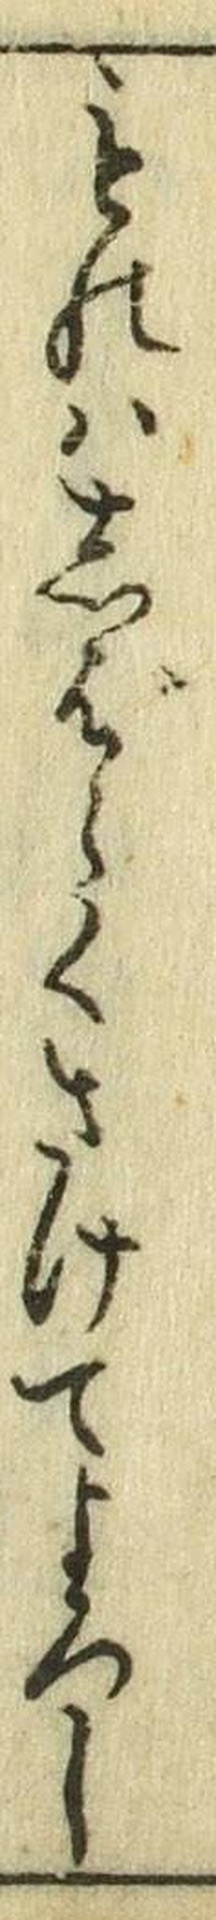ものはしばらくさけてよろし
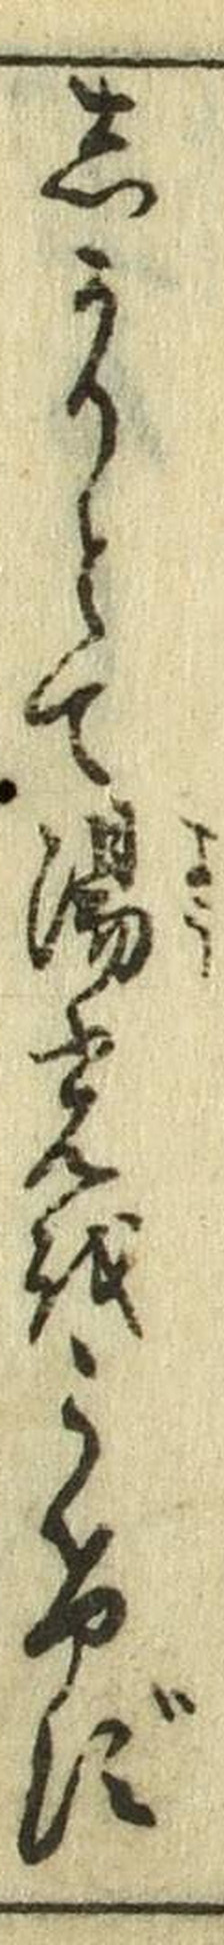しかりとて陽光をうけず
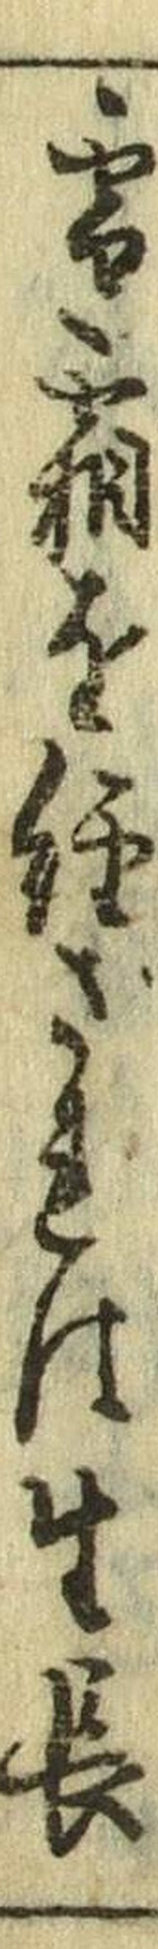雪霜を経ざれは生長

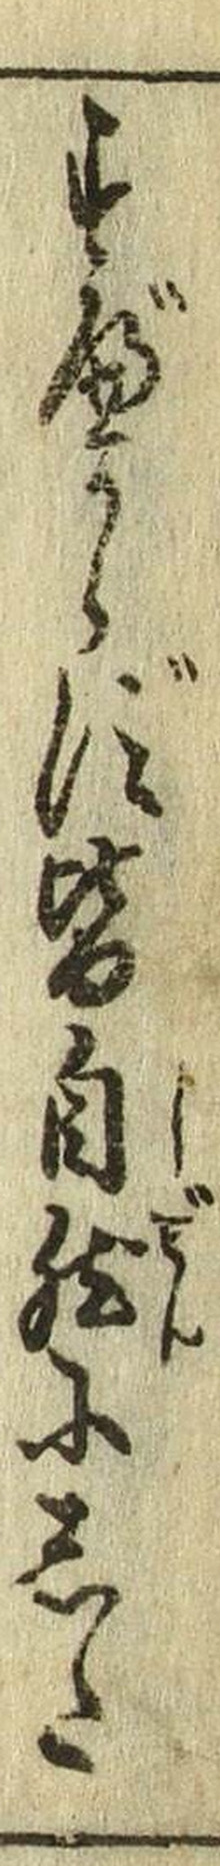すべからず皆自然にした
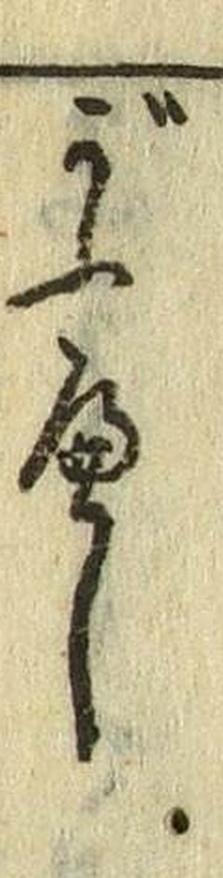がふへし
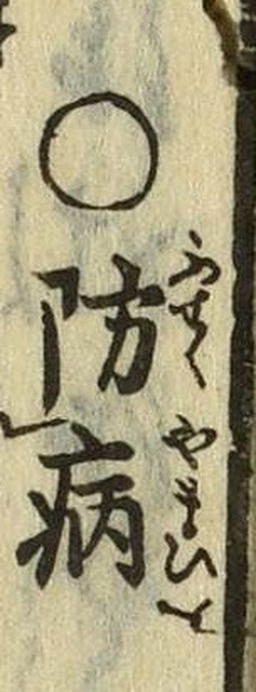○防病
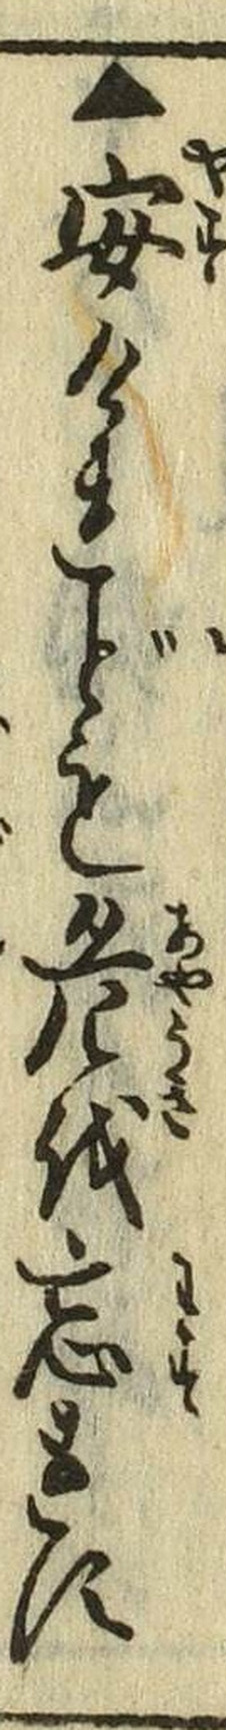▲安けれども危を忘れす
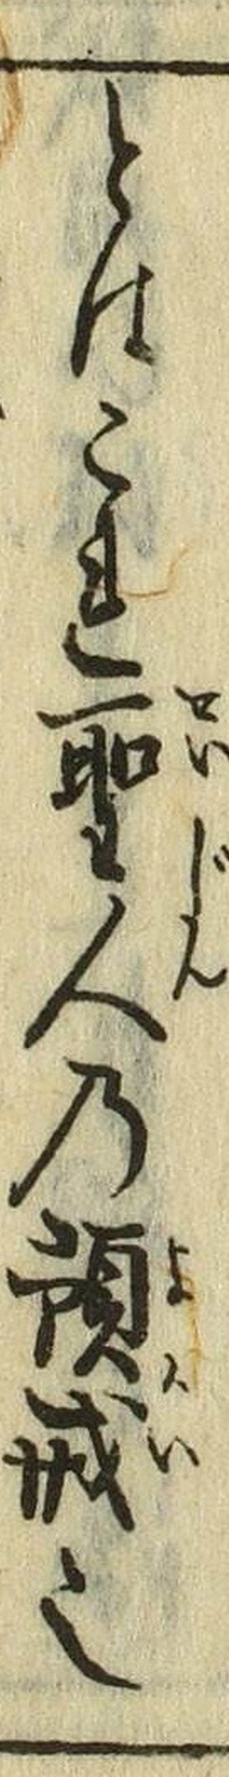とはこれ聖人の予戒也
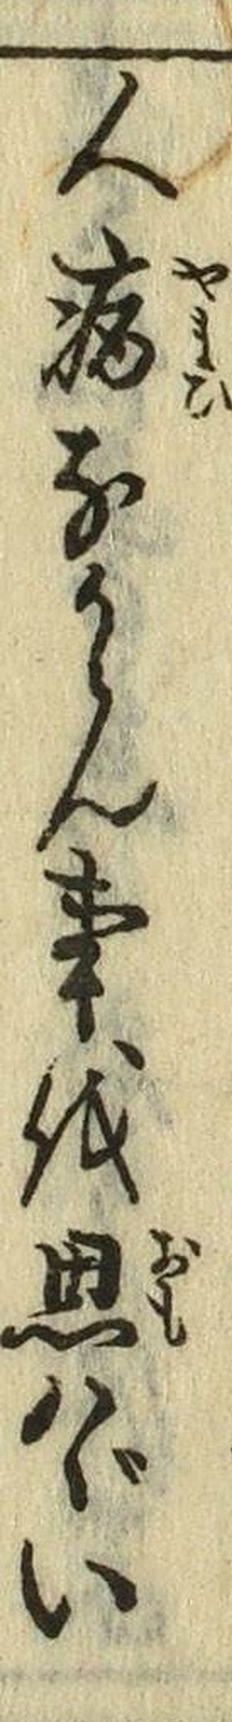人病なからん事を思はゞい
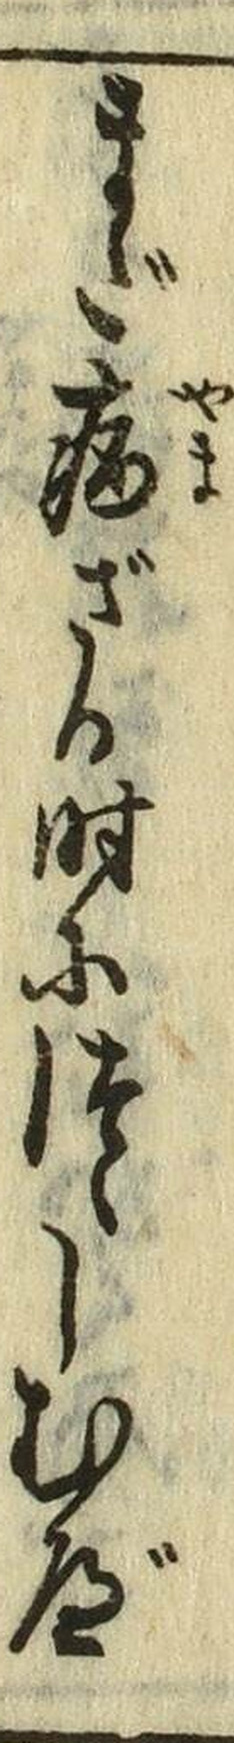まだ病ざる時につゝしむべ
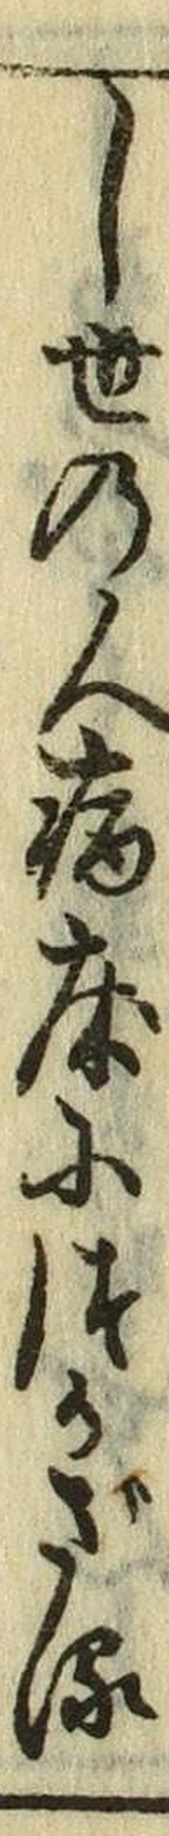し世の人病床につかざる
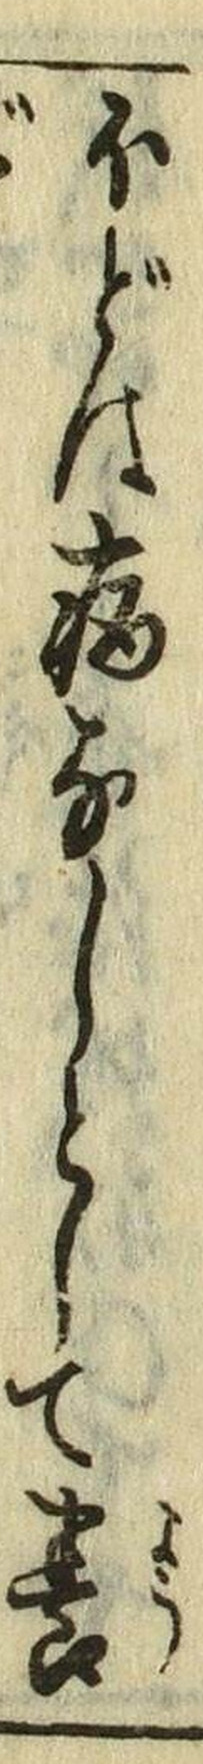ほどは病なしとして養
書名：居家養生記
